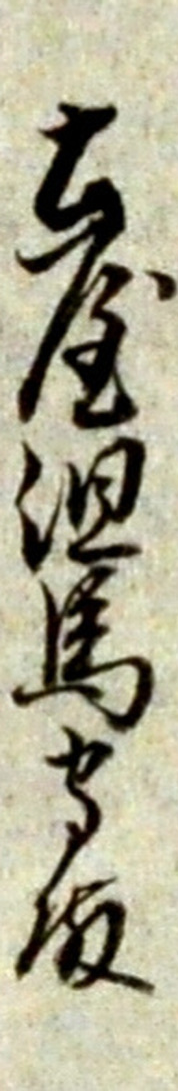土屋但馬守殿
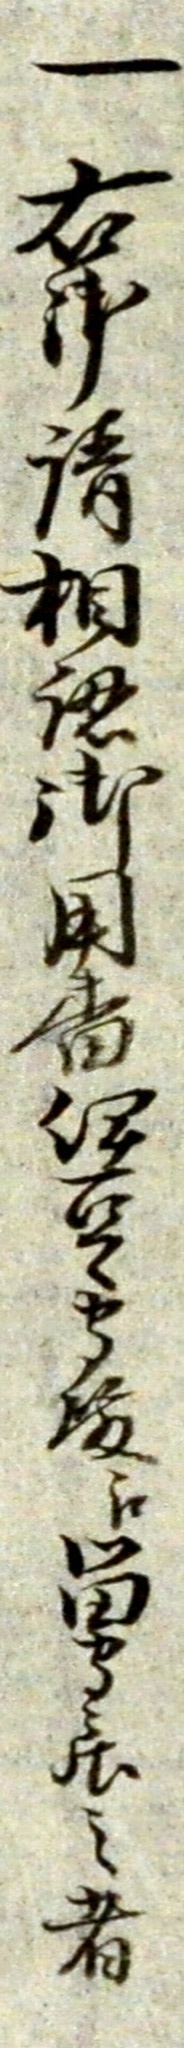一右御請相認御用番伊豆守殿江留守居之者
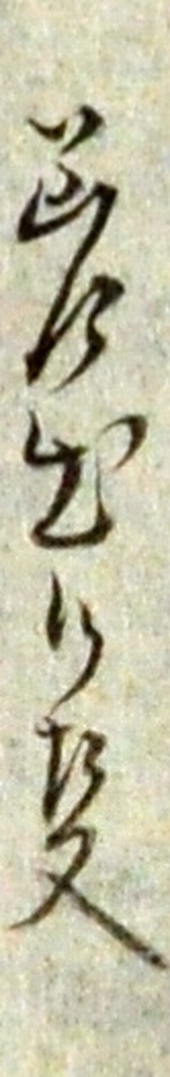差出候事
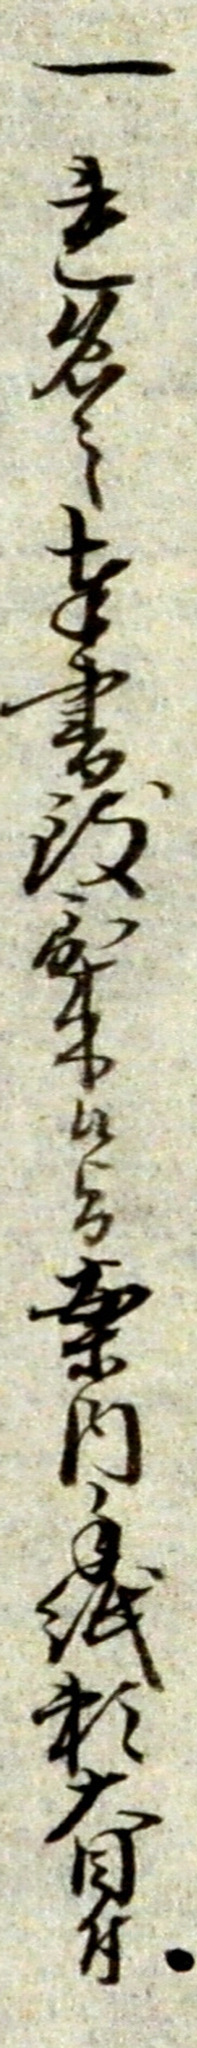一連名之奉書致到来候旨案内手紙頼大目付
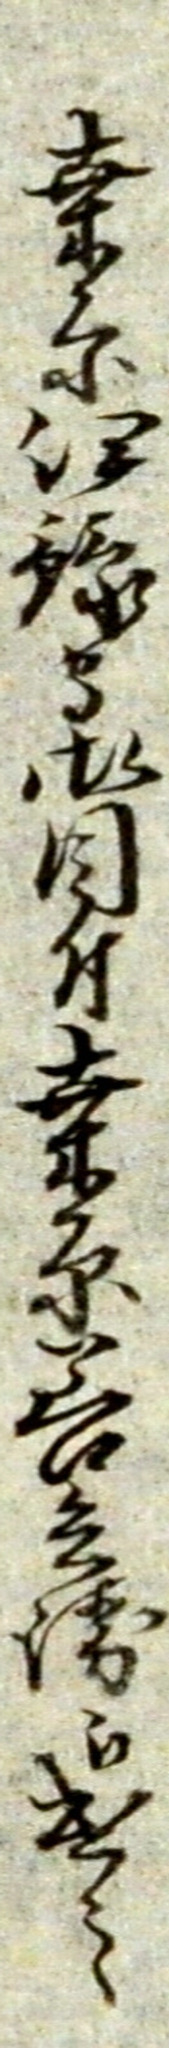桑原伊予守御目付桑原善兵衛江遣之
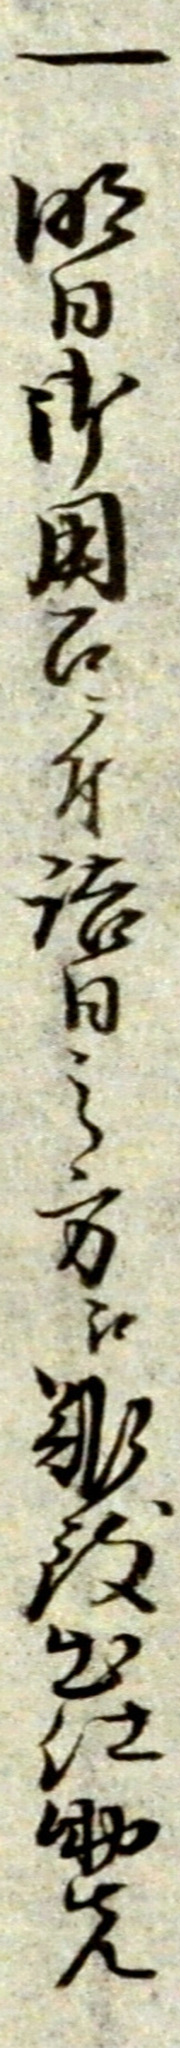一昨日御用召ニ付詰日之方江難致出仕助先
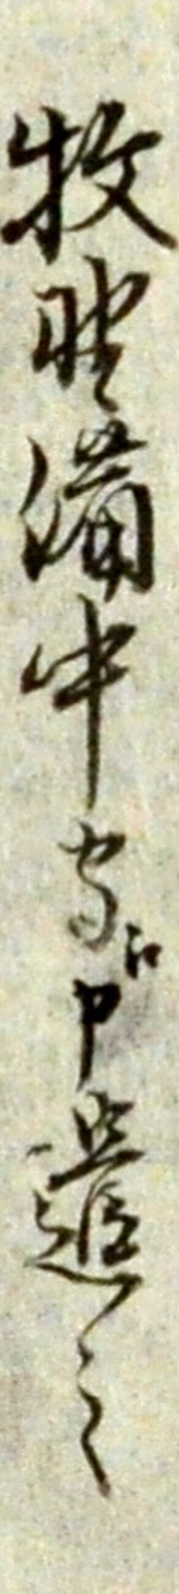牧野備中守江申遣之
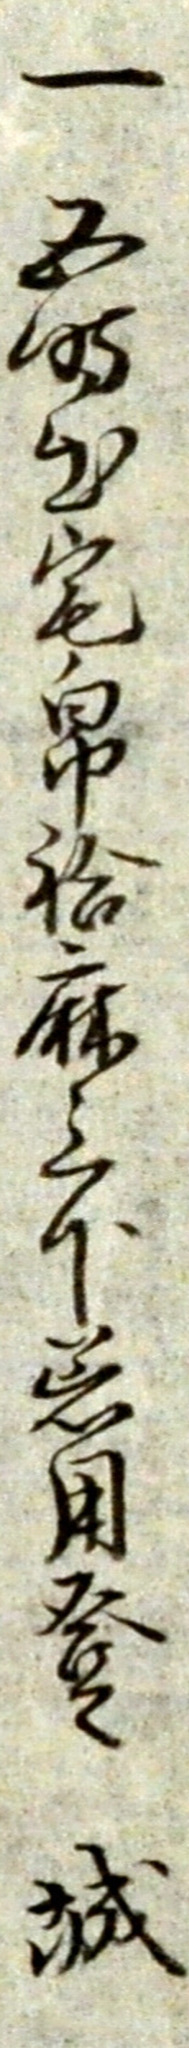一五時出宅帛袷麻上下着用登城
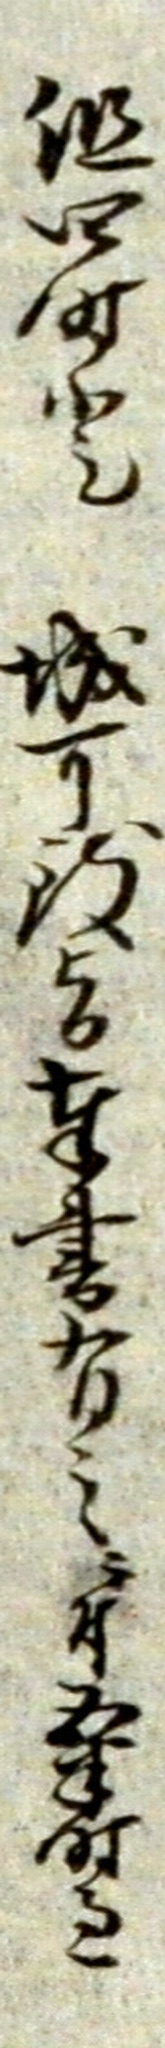但し四時登城可致旨奉書有之ニ付五半時過
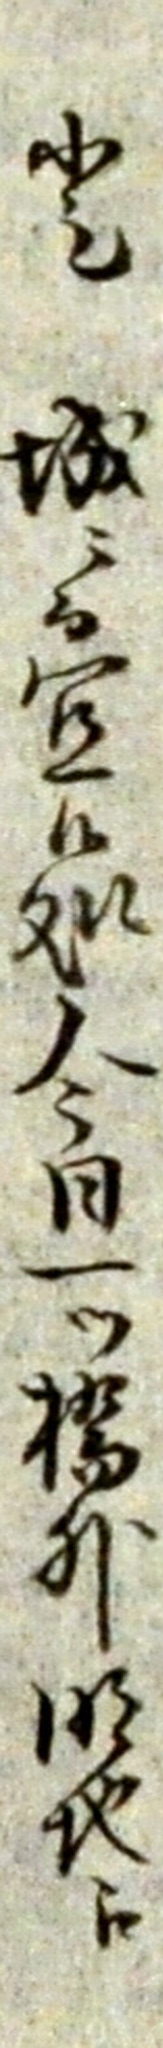登城ニ而宜候処今日一ッ橋外明地江
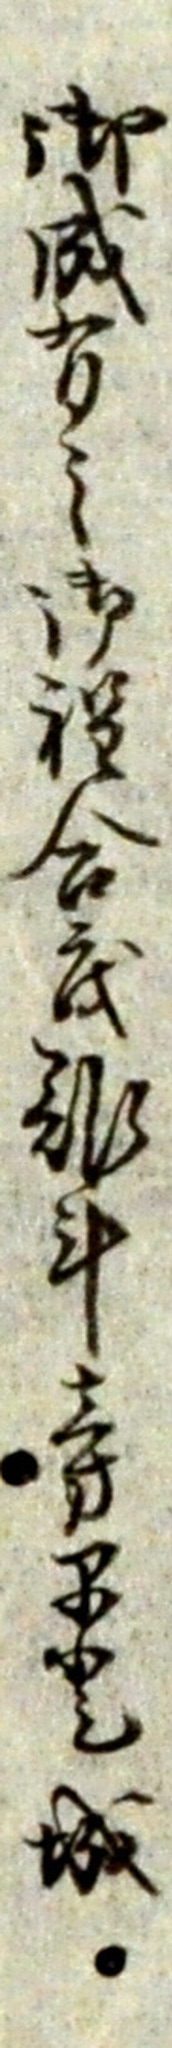御成有之御程合茂難計旁早登城

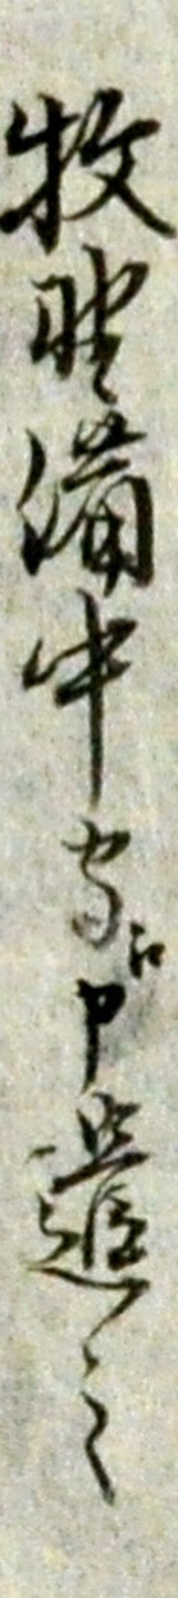牧野備中守申遣之
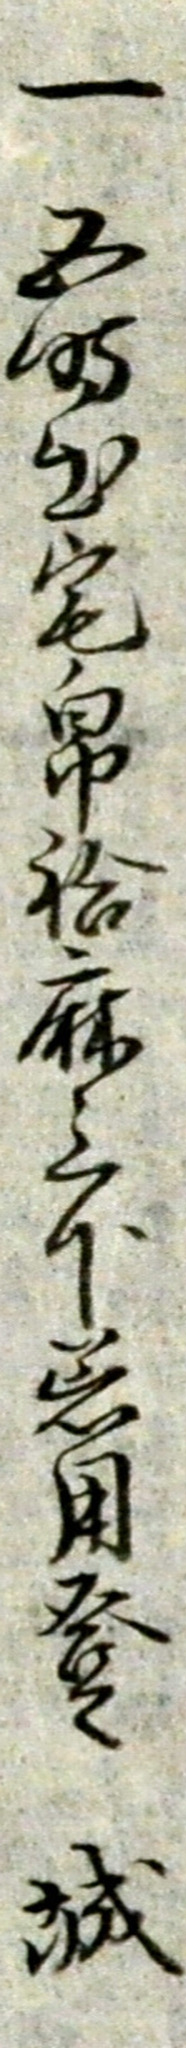一五時出宅帛袷麻上下着用登城
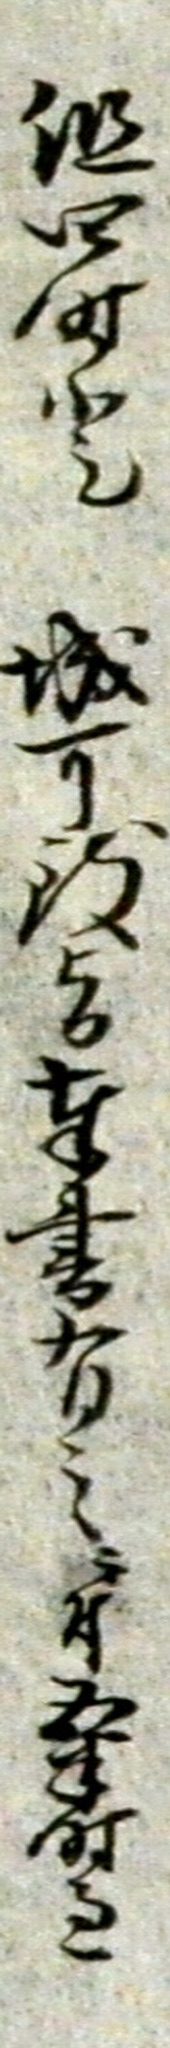但四時登城可致旨奉書有之ニ付五時過
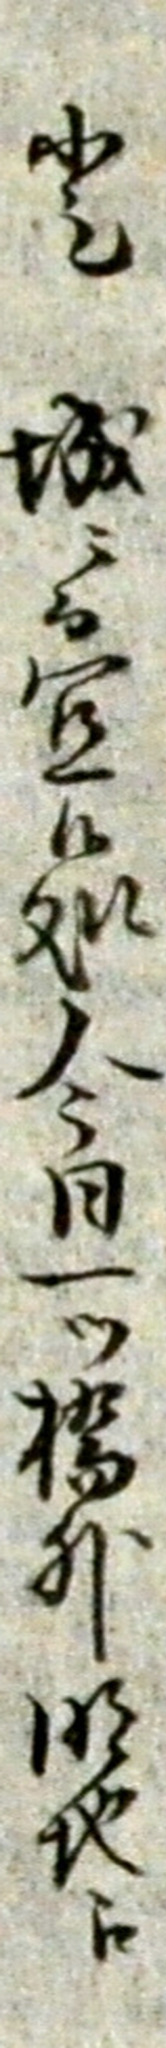登城ニ而宣候処今日一つ橋外明地江
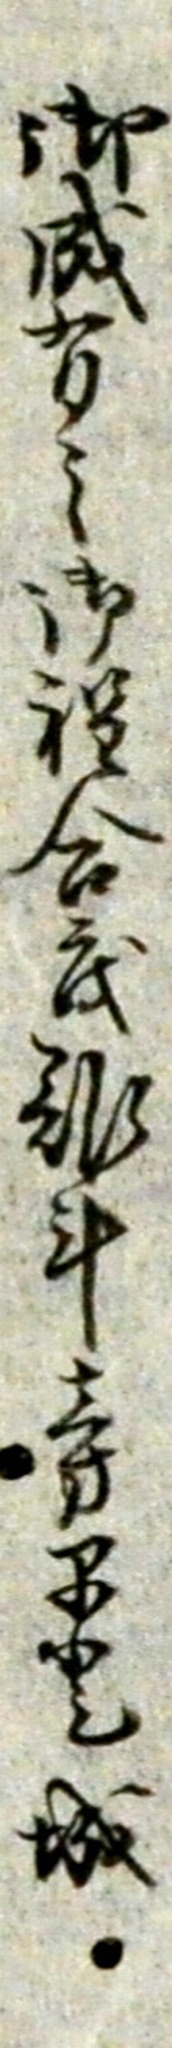御成有之御程合茂難斗旁早登城
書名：日光御名代相勤候節ノ留
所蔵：伊那市立高遠町図書館・合同会社AMANE
